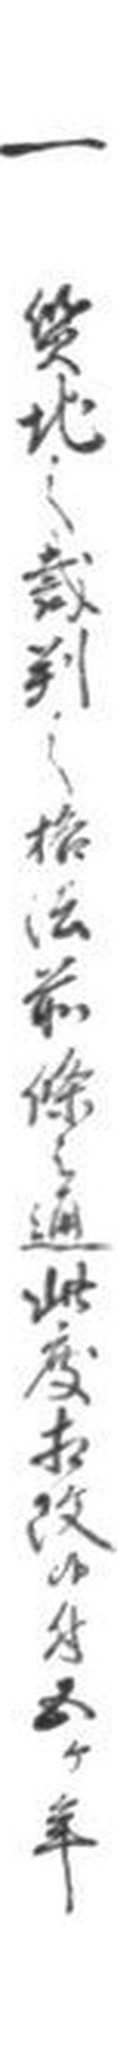一質地之裁判之格法前条之通此度相改候付五ケ年
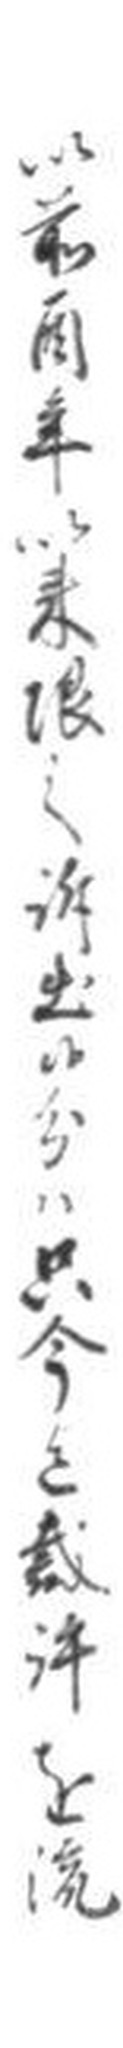以前酉年以来限之訴出候分ハ只今迄裁許を流
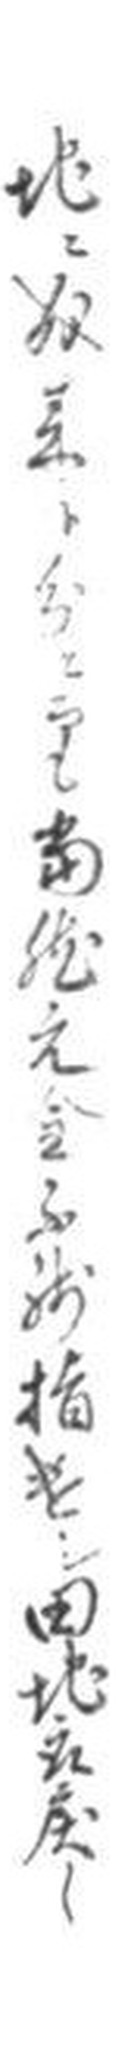地ニ成来候分と而も当然元金不残指遣シ田地取戻し
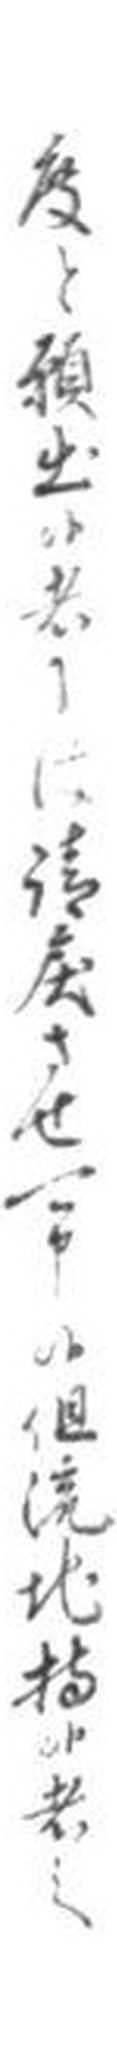度と願出候者には請戻させ可申候但流地持候者之
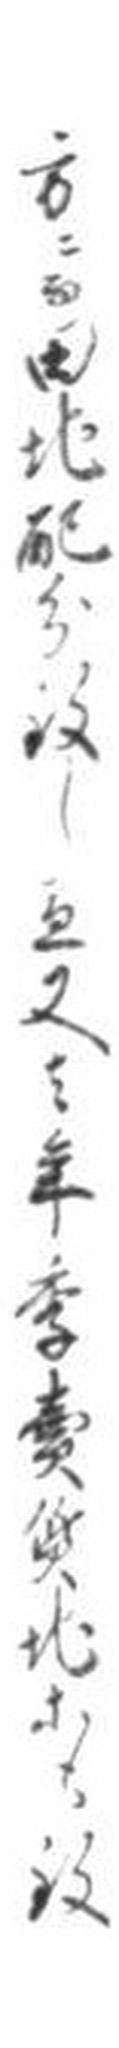方ニ而田地配分致し置又者年季売質地等も致
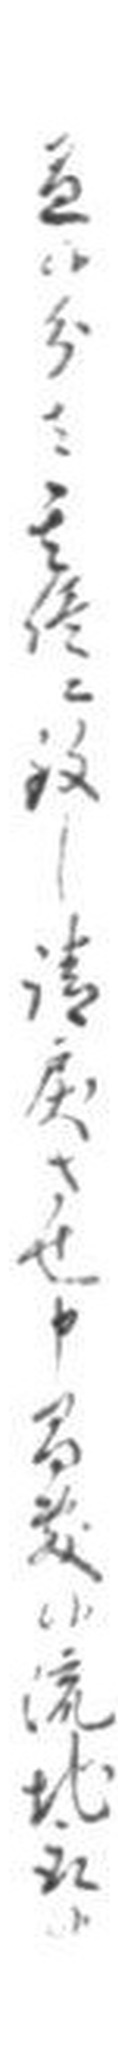置候分者其儘ニ致し請戻させ申間敷候流地取候
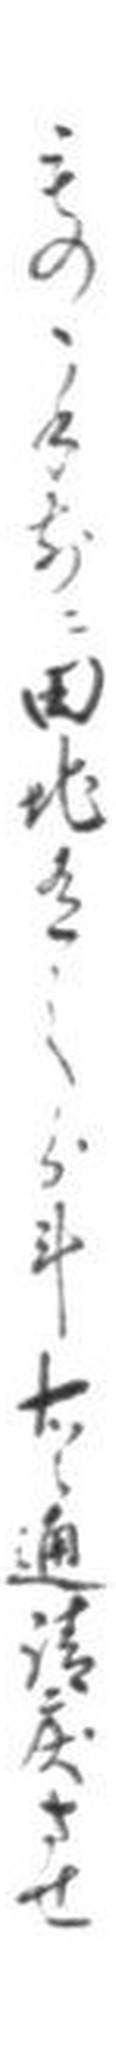ものへ手前ニ田地有之分斗右之通請戻させ
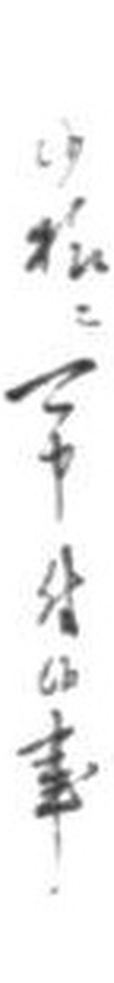候様ニ可申付候事
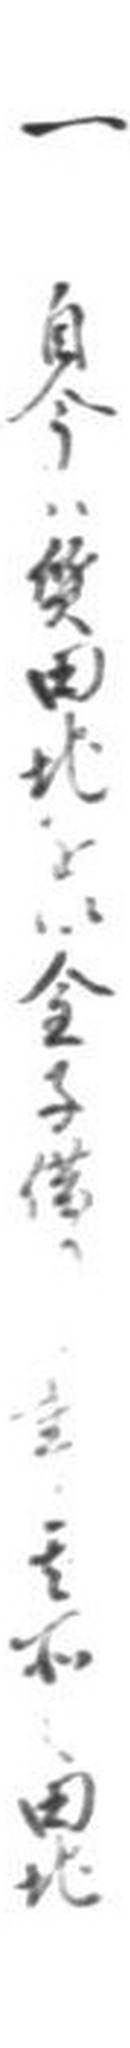一自今ハ質田地を以金子借り候事其所之田地
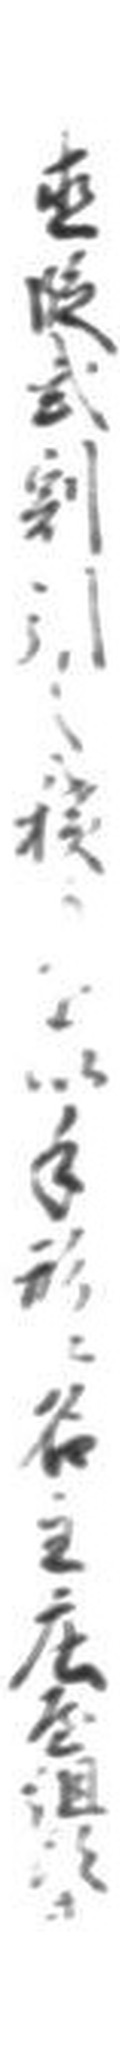直段弐割引之積りを以手形ニ名主庄屋組頭
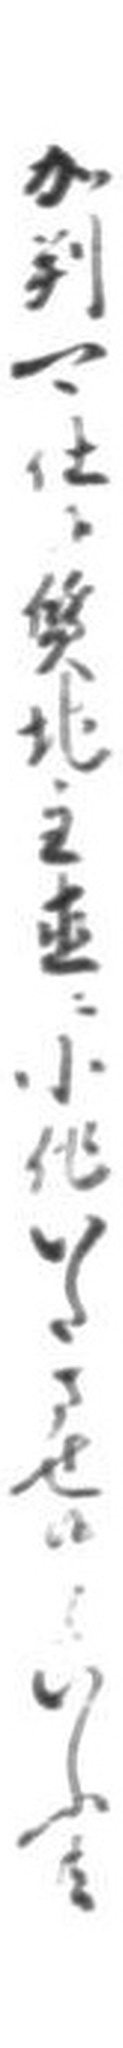加判可仕候質地主直ニ小作いたさせ候といふ共
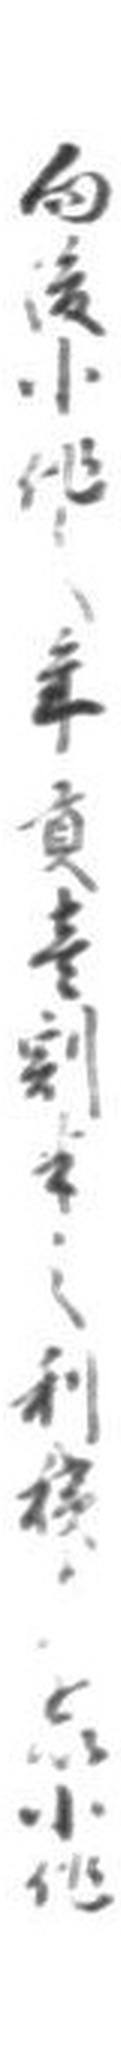向後小作之年貢壱割半之利積りを以小作
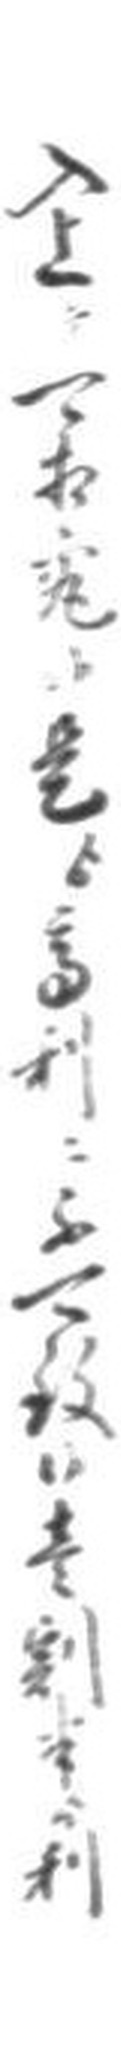入上ケ可相究候是ゟ高利ニ不可致候壱割半ゟ利
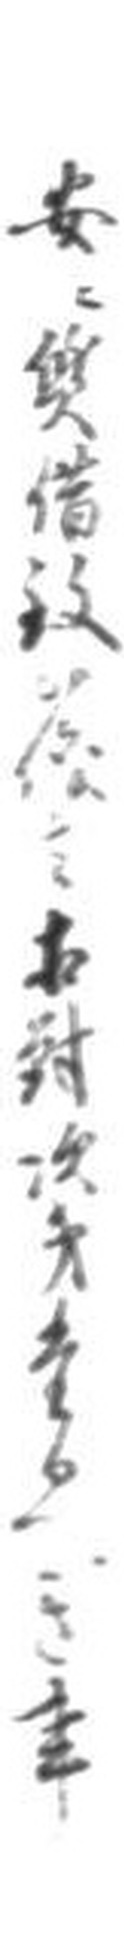安ニ質借致候儀者相対次第たるへき事
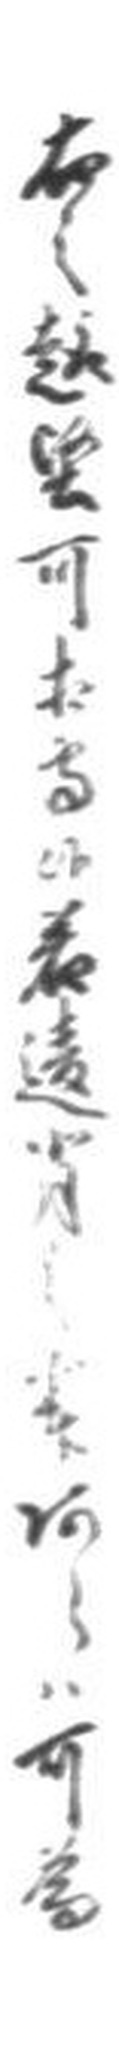右之趣堅可相守候若違背之輩あらハ可為
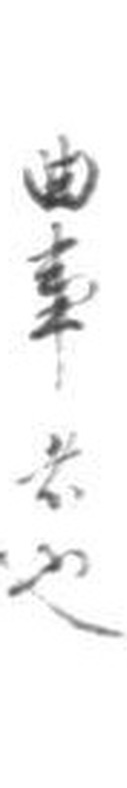曲事者也
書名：家譜 三十五 宗昌公 従享保六年到同七年
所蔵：福井県文書館 Fukui Prefectural Archives
